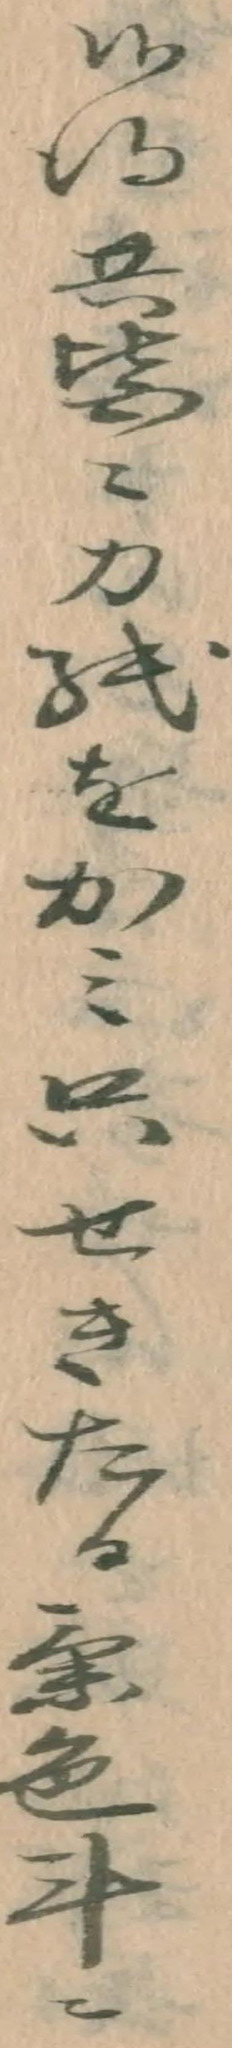候得共皆々力残をかみ只せきたる気色斗に
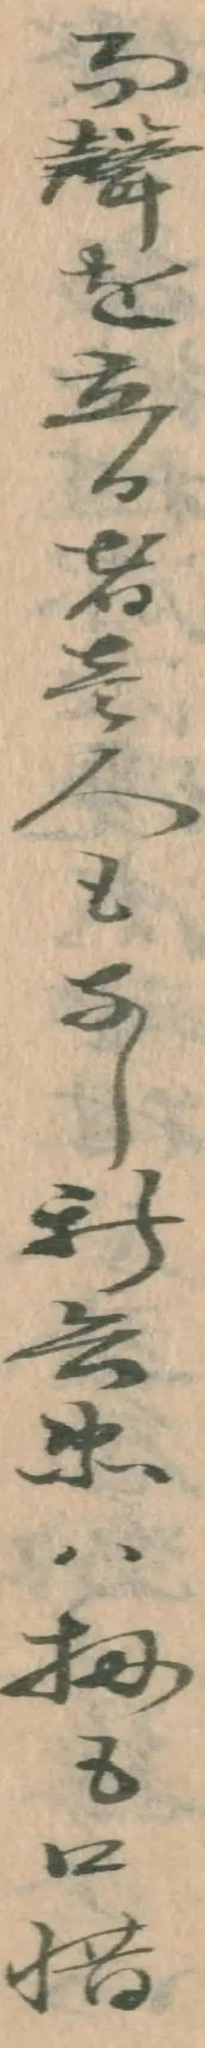而声を立る者壱人もなし新兵衛は扨も口惜
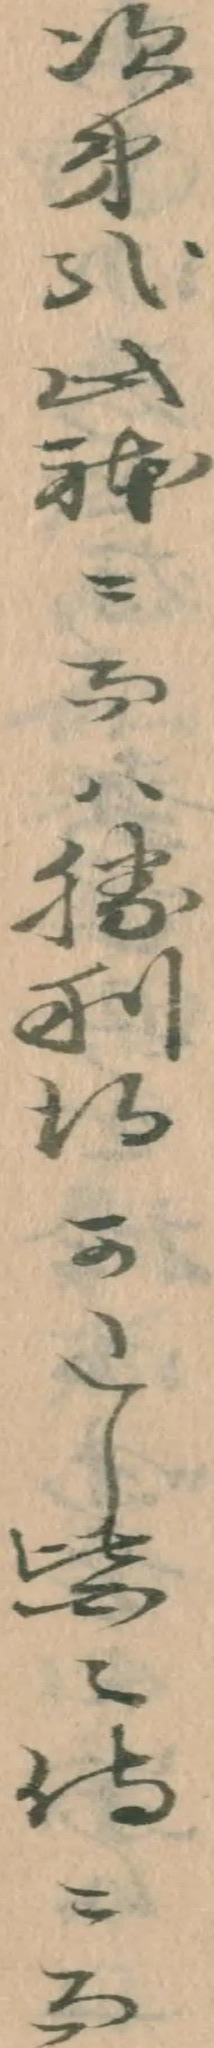次第哉此躰に而は勝利得かたし皆々侍に而
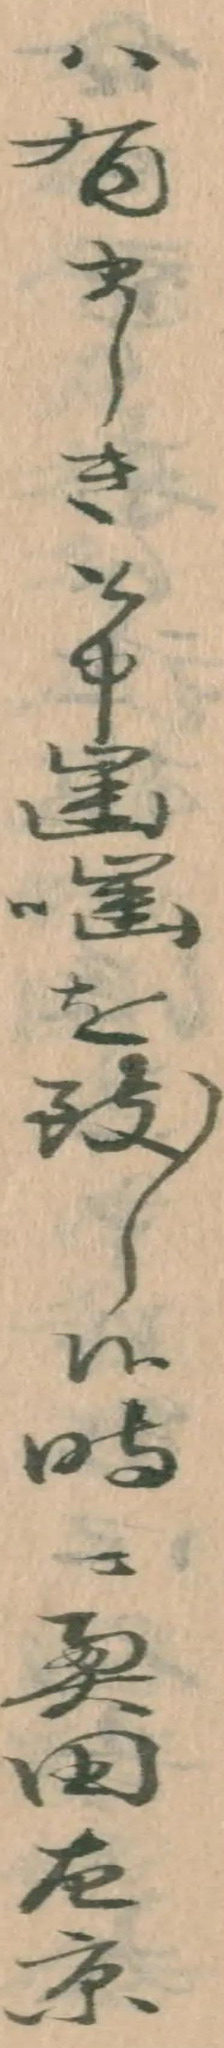は有ましきと申歯噛を致し候時に奥田左京
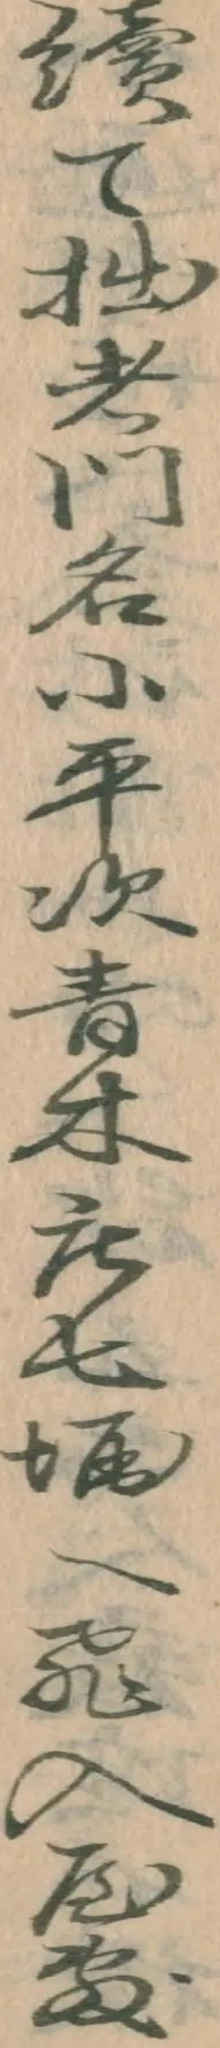続て拙者門名小平次青木庄七堀へ飛入屋敷
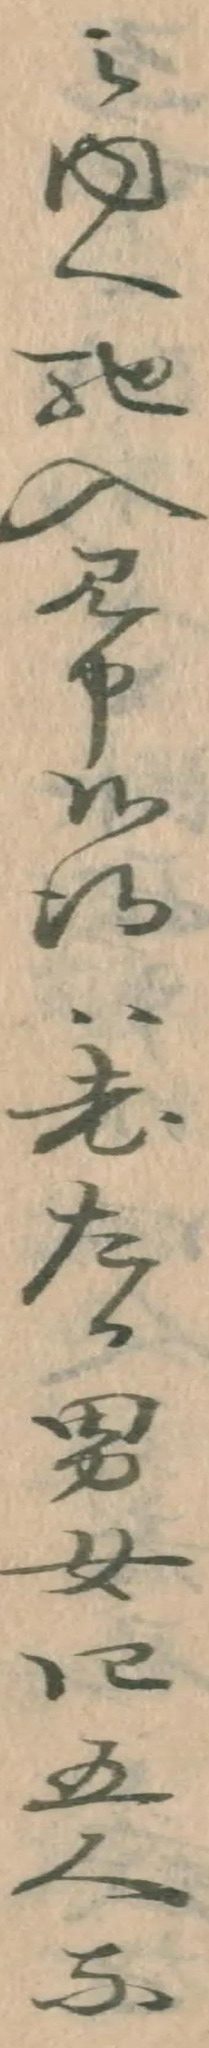之内へ馳入見申候得は老たる男女四五人な
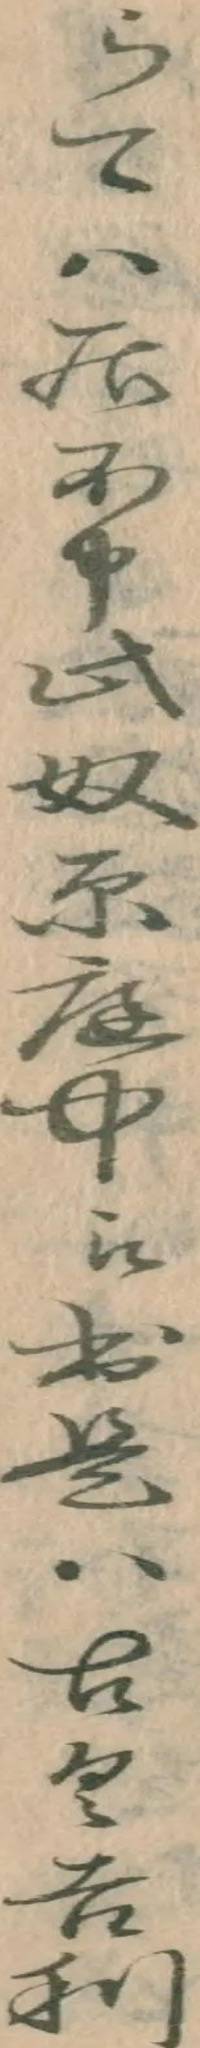らては居不申此やつ奴原庭中え出是は古具吉利
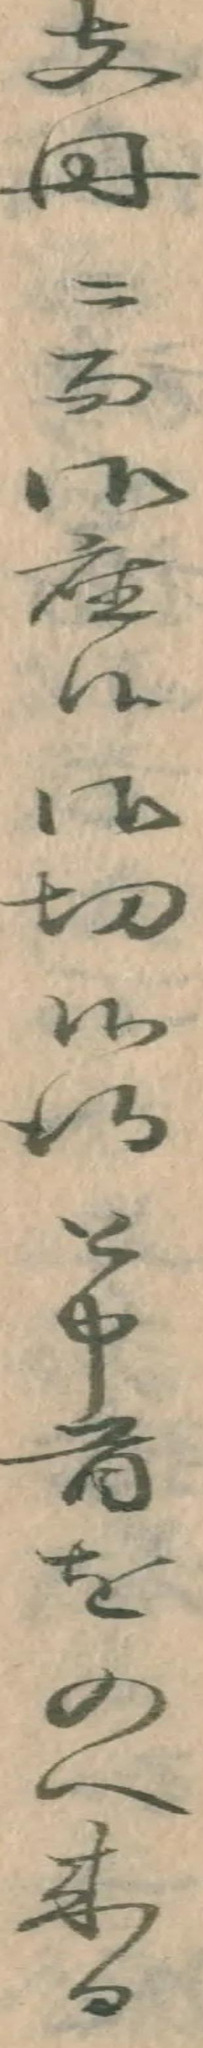支丹に而御座候御切候得と申首をのへ来る
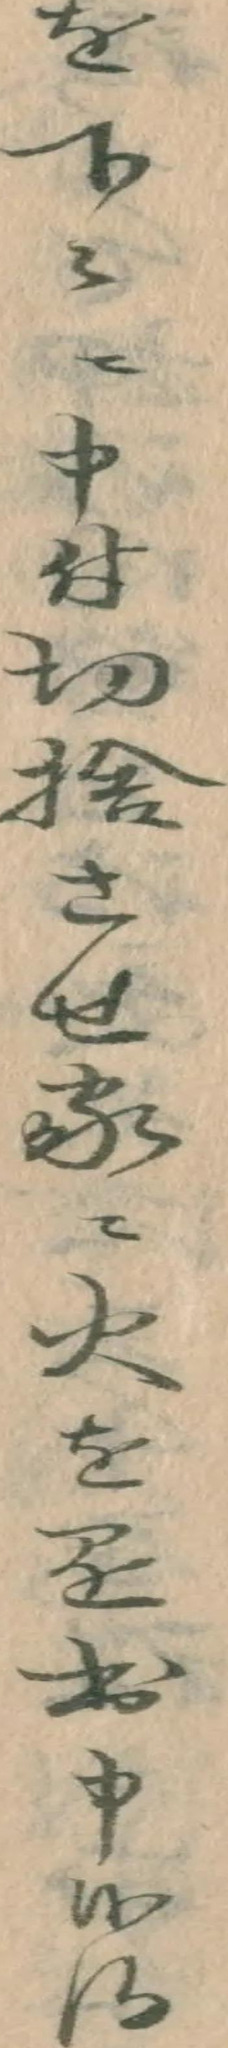を下々に申付切捨させ家に火を懸出申候得
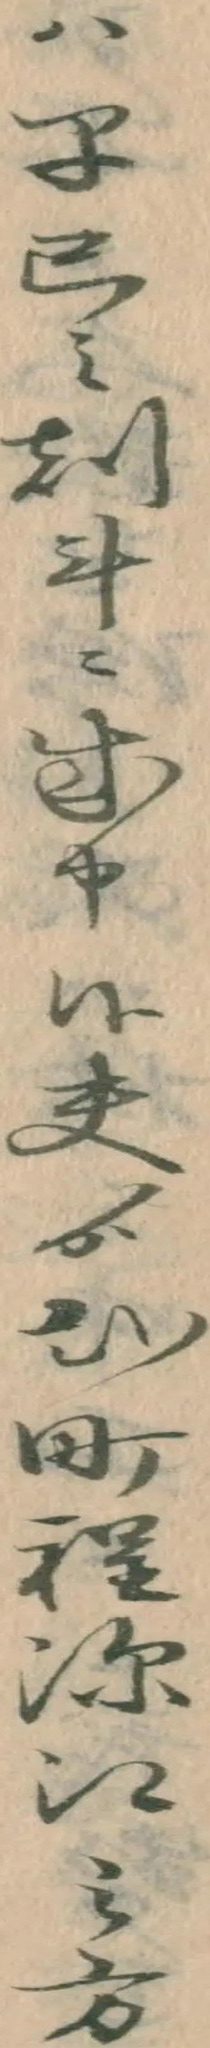は早巳之刻斗に成申候夫ゟ弐町程深江之方
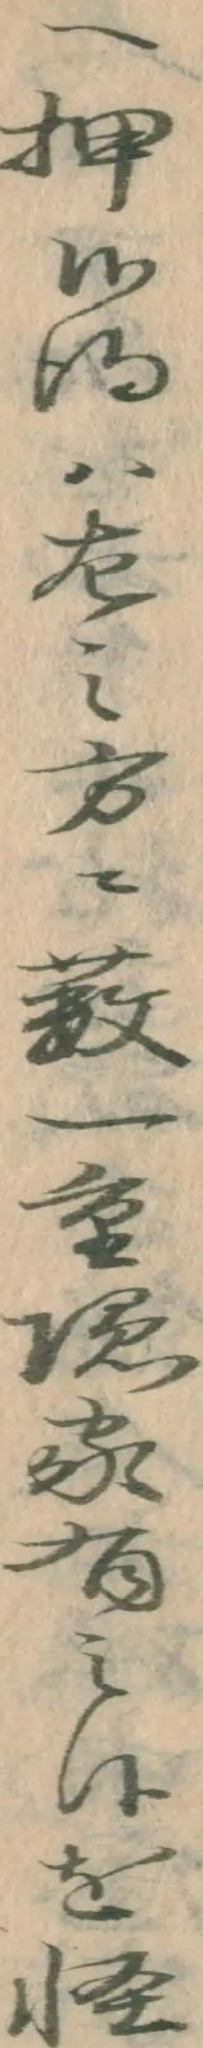へ押候得は左之方に薮一重隠家有之候を怪
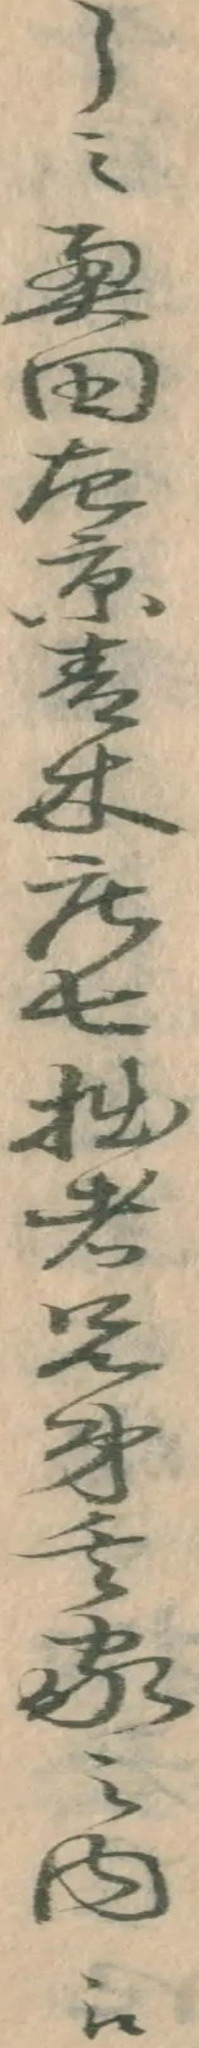しみ奥田左京青木庄七拙者兄弟其家之内え
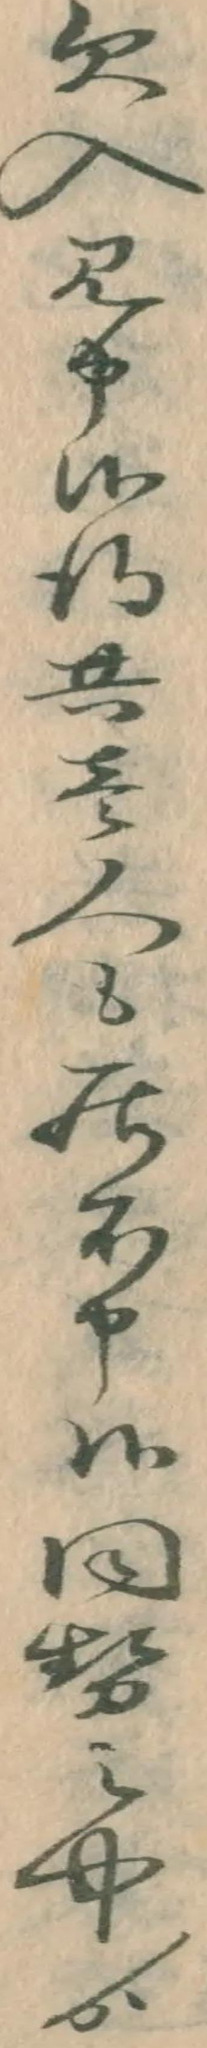欠入見申候得共壱人も居不申候同勢之中ゟゝ

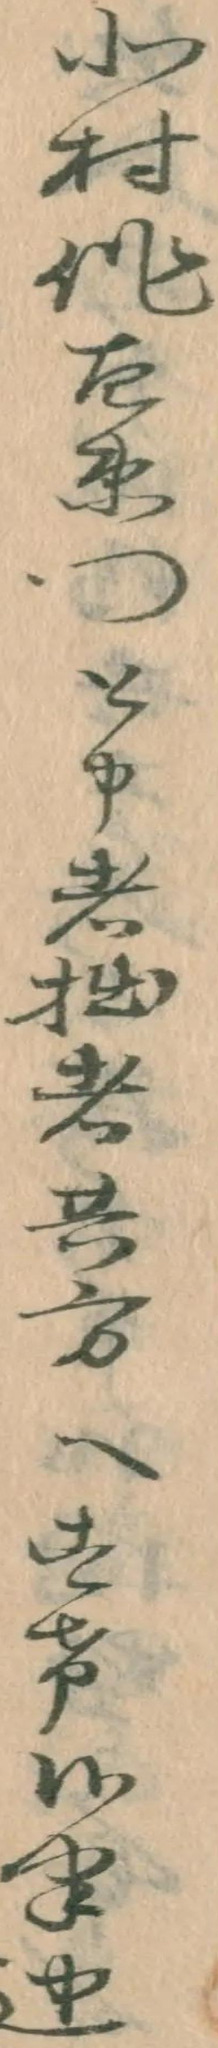北村作左衛門と申者拙者共方へすけ候半迚
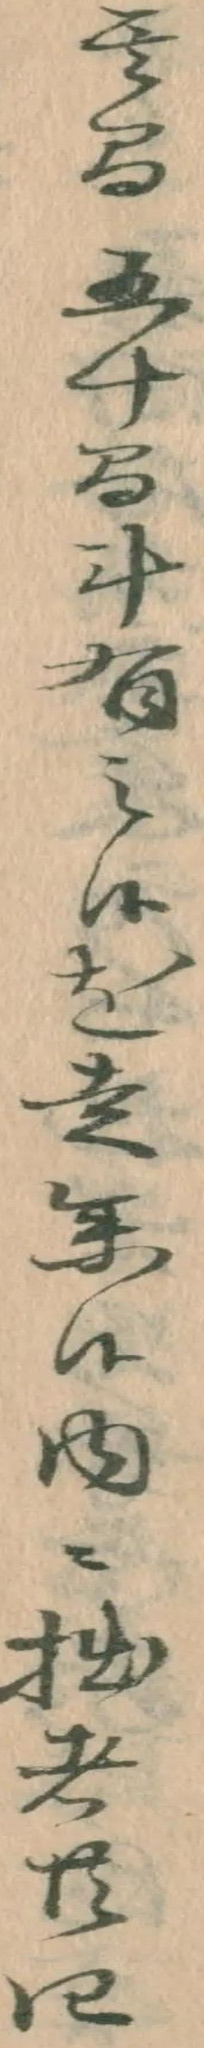其間五十間斗有之候を走参候内に拙者共四
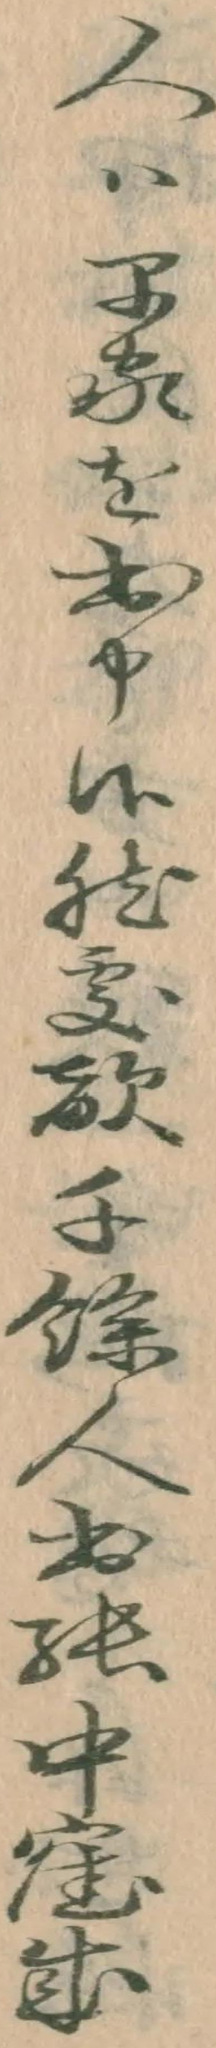人は早家を出申候然処敵千余人出張中窪成
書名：切支丹御退治記 49巻. [1]
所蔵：国立国会図書館 National Diet Library, JAPAN
